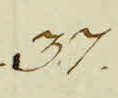37
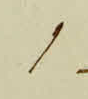1
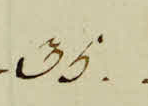35.
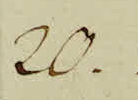20.
